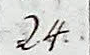24
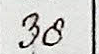38
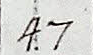47
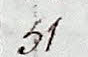51
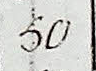50
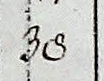38
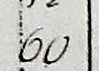60
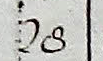28
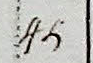45
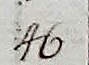46
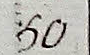50
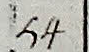54
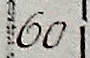60
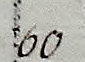60
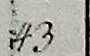43
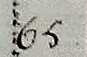65
